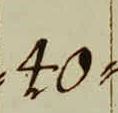40
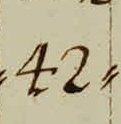42
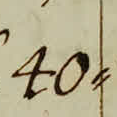40
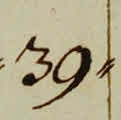39
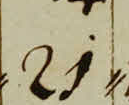21
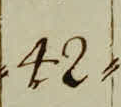42
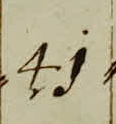41
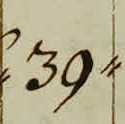39
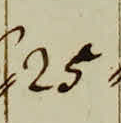25
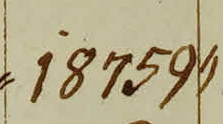18759
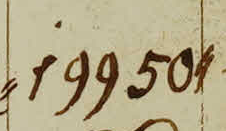19950
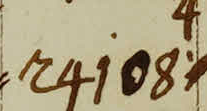24108
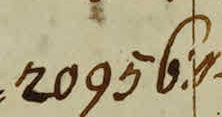20956:
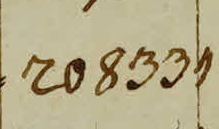20833
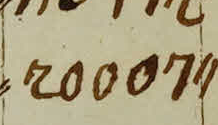20007
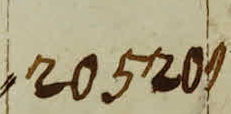20520
